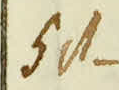58
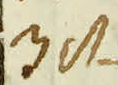38
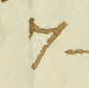7
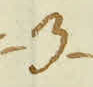3
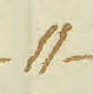11
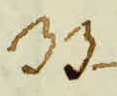33
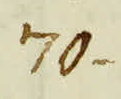70
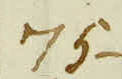75
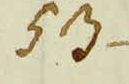53
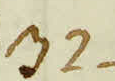32
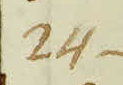24
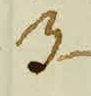3
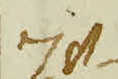78
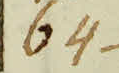64
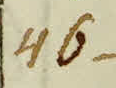46
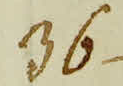36
